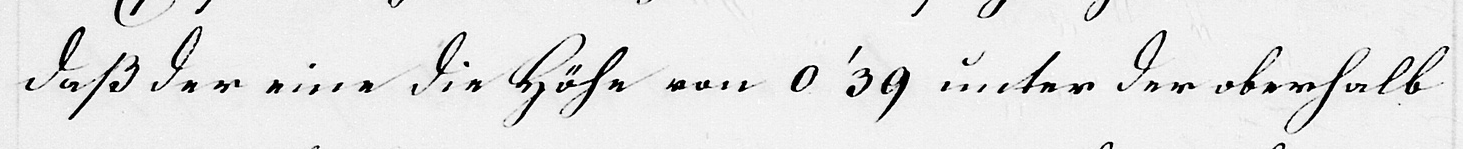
daß der eine die Höhe von 0 [Fuss] 39 unter der oberhalb
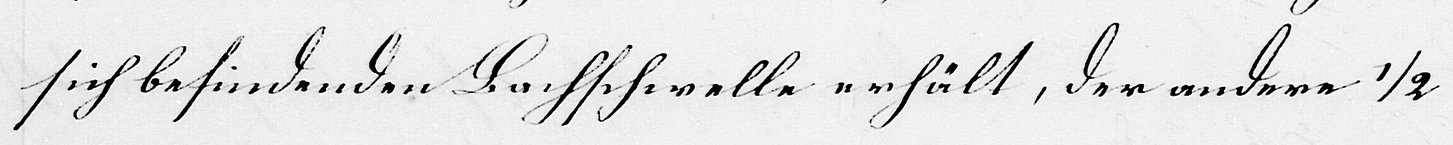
sich befindenden Bachschwelle erhält, der andere ½
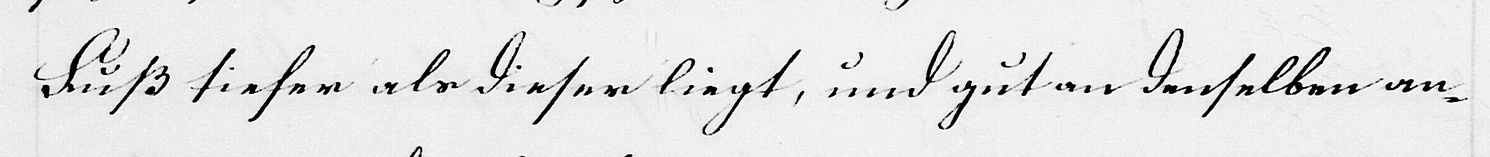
Fuß tiefer als dieser liegt, und gut an denselben an¬
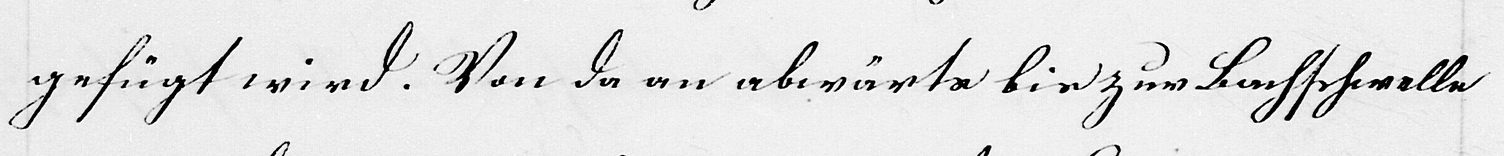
gefügt wird. Von da an abwärts bis zur Bachschwelle
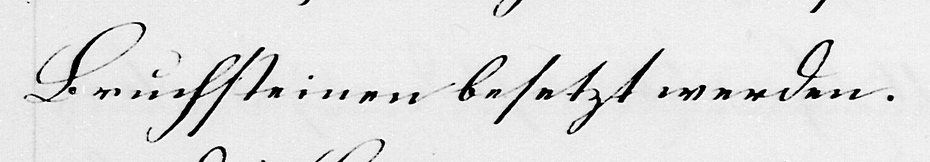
Bruchsteinen besetzt werden.
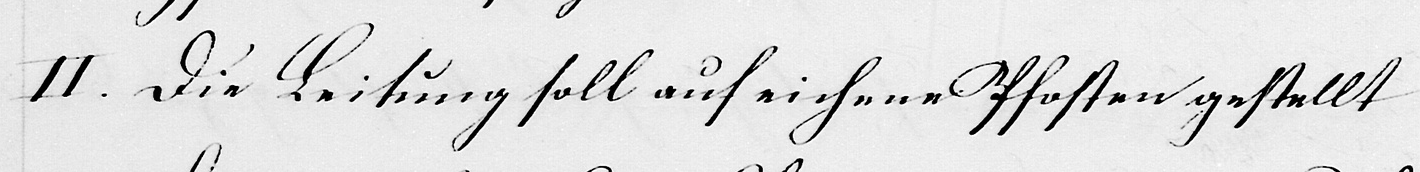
II. Die Leitung soll auf eichene Pfosten gestellt
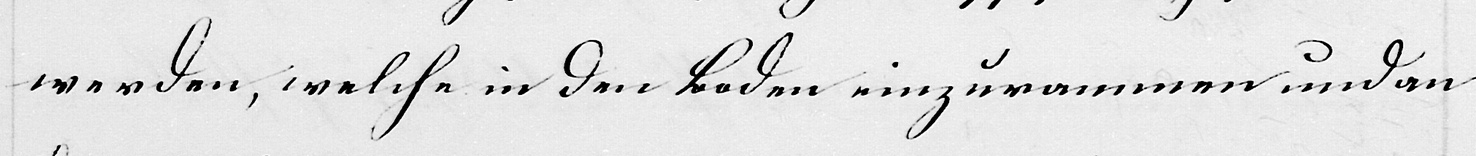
werden, welche in den Boden einzurammen und an
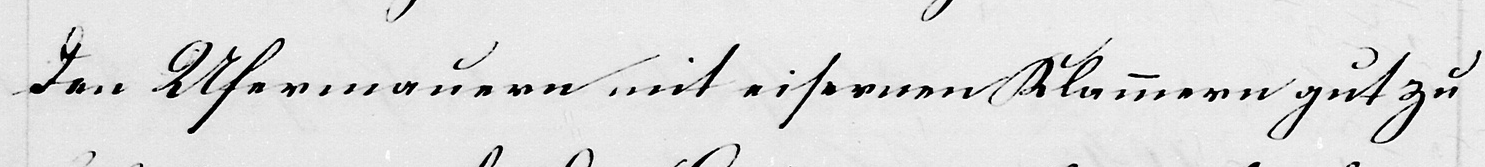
den Ufermauern mit eisernen Klammern gut zu
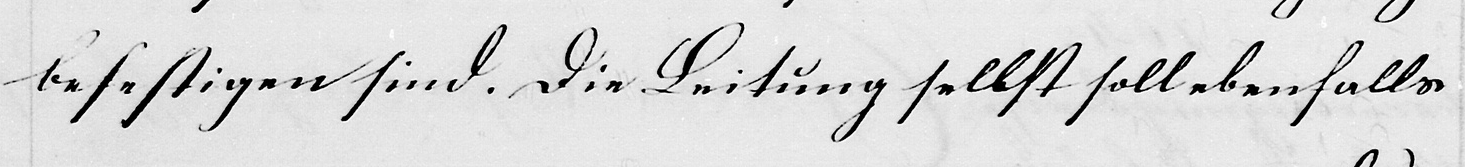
befestigen sind. Die Leitung selbst soll ebenfalls
